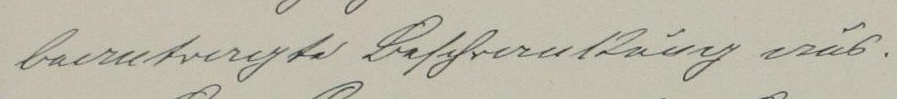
beantragte Beschrankung aus.
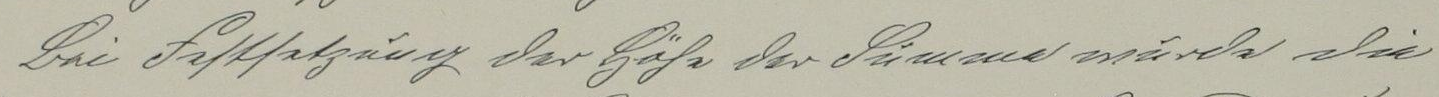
Bei Festsetzung der Höhe der Summe wurde die
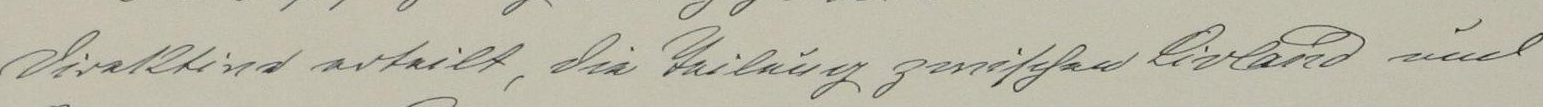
Direktive erteilt, die Teilung zwischen Livland und
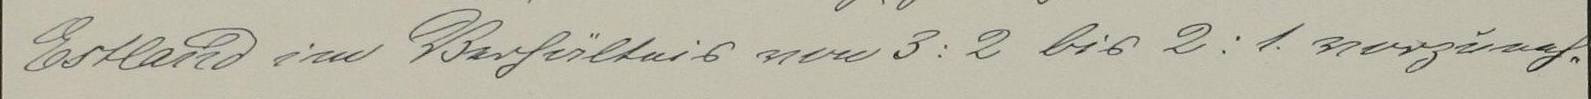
Estland im Verhältnis von 3 : 2 bis 2 : 1 vorzuneh-
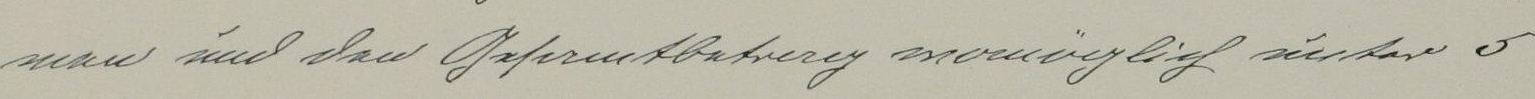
men und den Gesamtbetrag womöglich unter 5
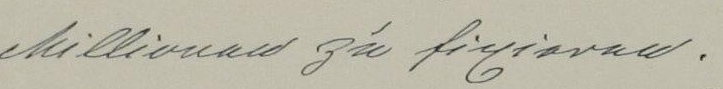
Millionen zu fixieren.
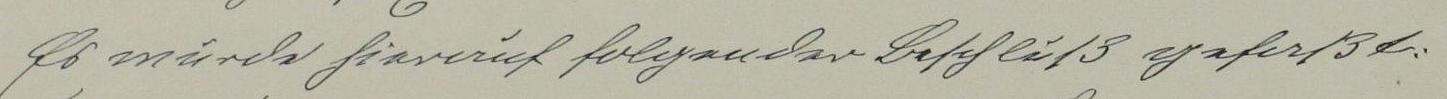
Es wurde hierauf folgender Beschluß gefaßt:
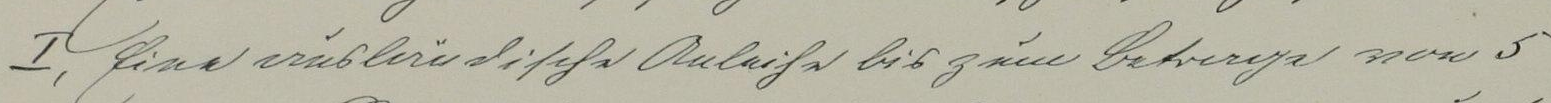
I. Eine ausländische Anleihe bis zum Betrage von 5
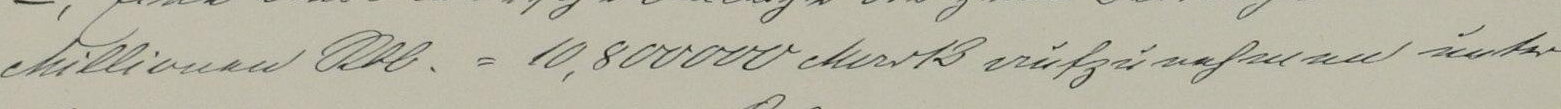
Millionen Rbl. 10.800000 Mark aufzunehmen unter
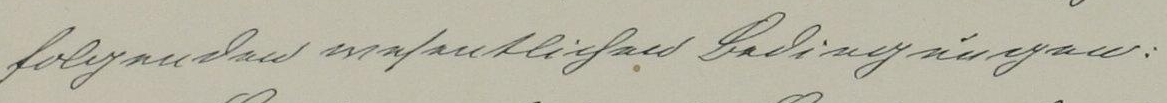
folgenden wesentlichen Bedingungen:
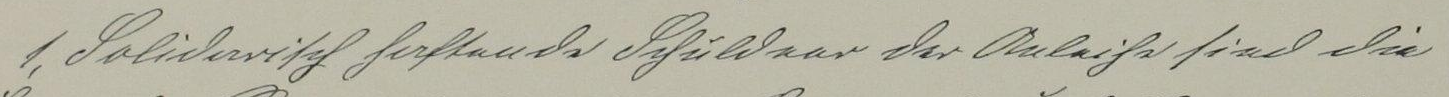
1. Solidarisch haftende Schuldner der Anleihe sind die
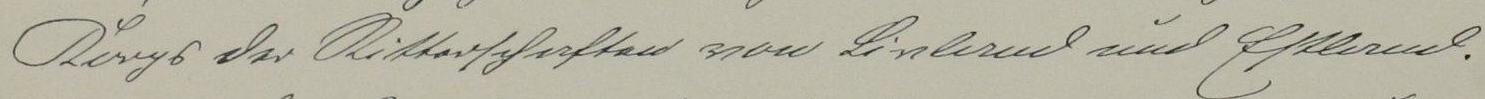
Korps der Ritterschaften von Livland und Estland.
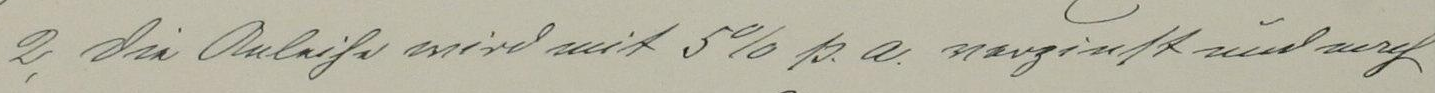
2. Die Anleihe wird mit 5% p.a. verzinst und nach
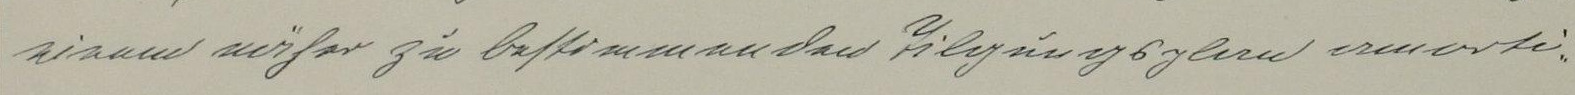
einem näher zu bestimmenden Tilgungsplan amorti-
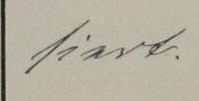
siert.
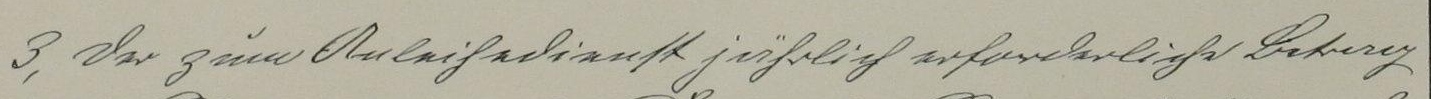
3. Der zum Anleihedienst jährlich erforderliche Betrag
